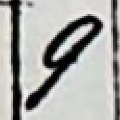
9
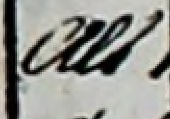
Alt
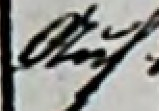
Aus„
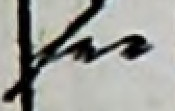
see
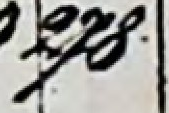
278
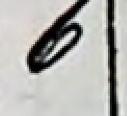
6
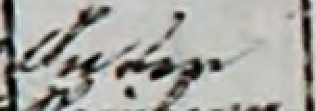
An der
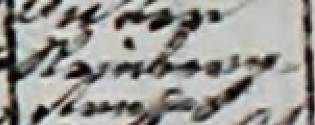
Steinberg„
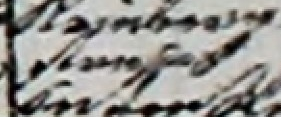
strasse
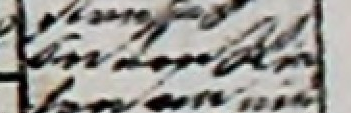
an den Wie
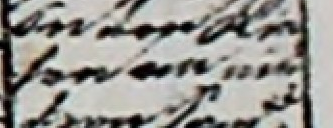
sen an un
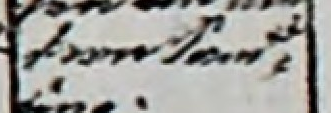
tern Sand„
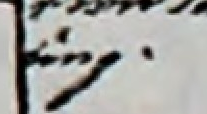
berg
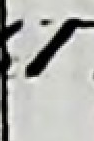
I
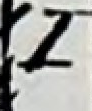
I
